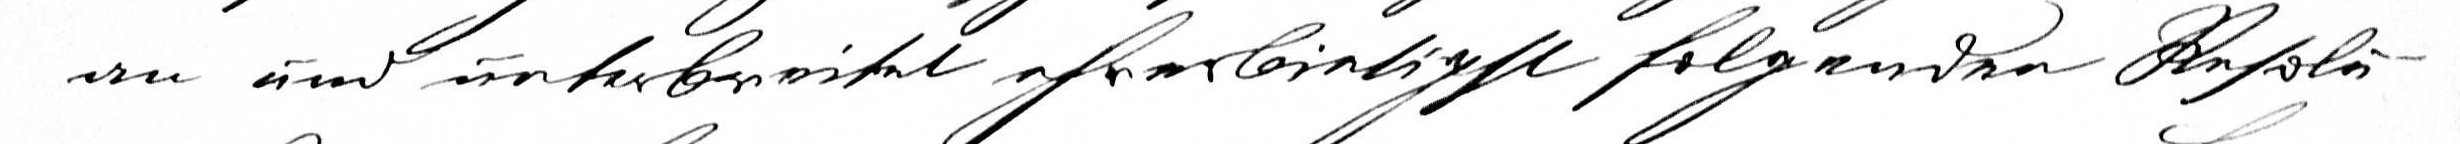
an und unterbreitet ehrerbietigst folgenden Resolu¬
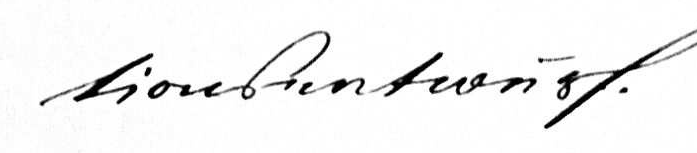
tionsentwurf.
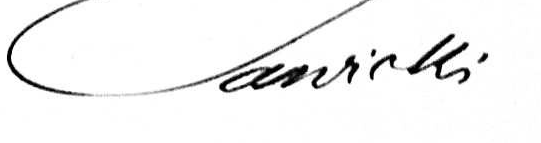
Sawicki
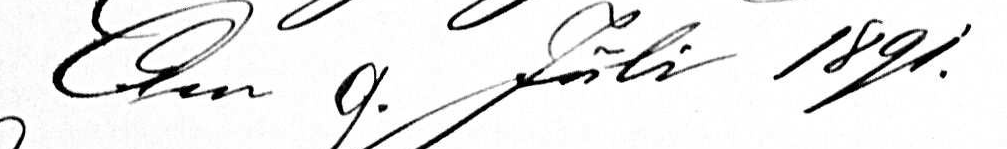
Am 9. Juli 1891
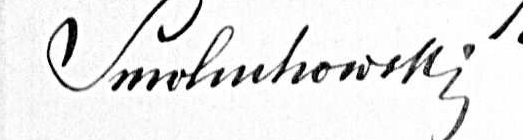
Smolnchowski
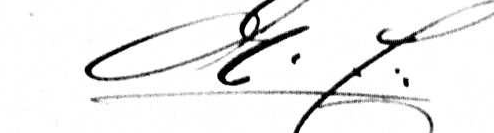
A E
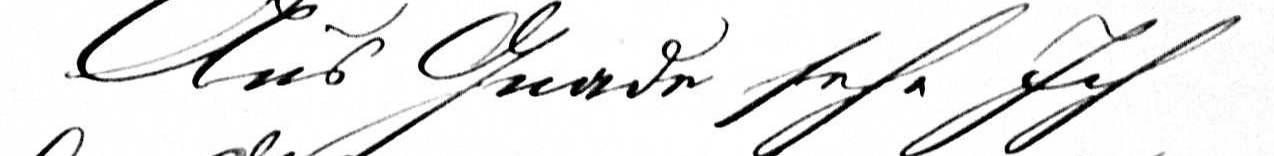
Aus Gnade sehe Ich
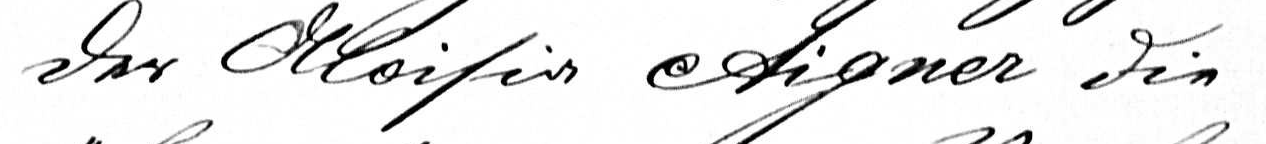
der Aloisia Aigner die
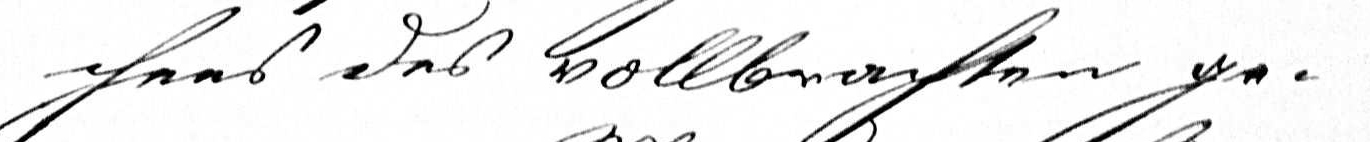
chens des vollbrachten ge¬
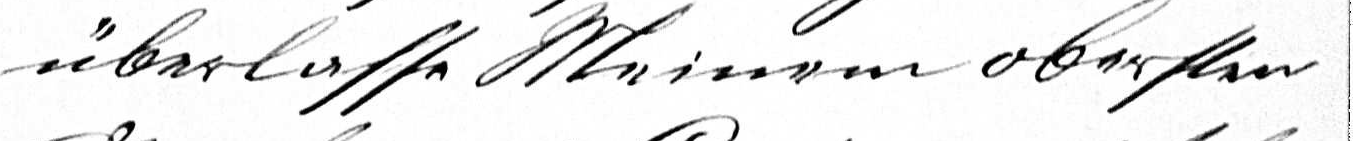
überlasse Meinem Obersten
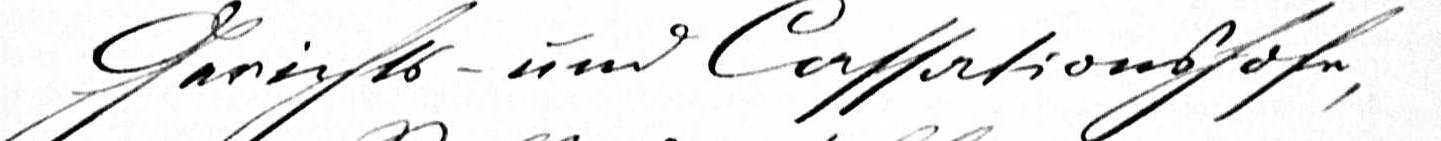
Gerichts- und Kassationshofe,
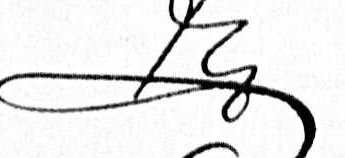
FJ
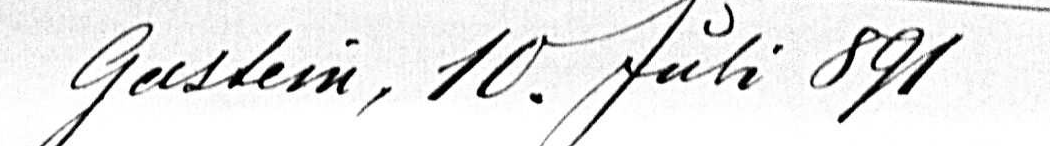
Gastein, 10. Juli 1891
